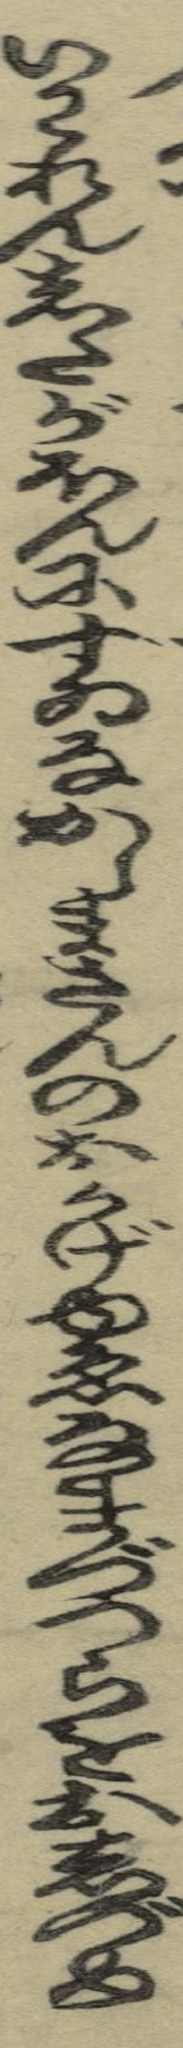いわれんしたがほんにすゐなかしまさんのおかげゆゑなまづつらをおしづめ
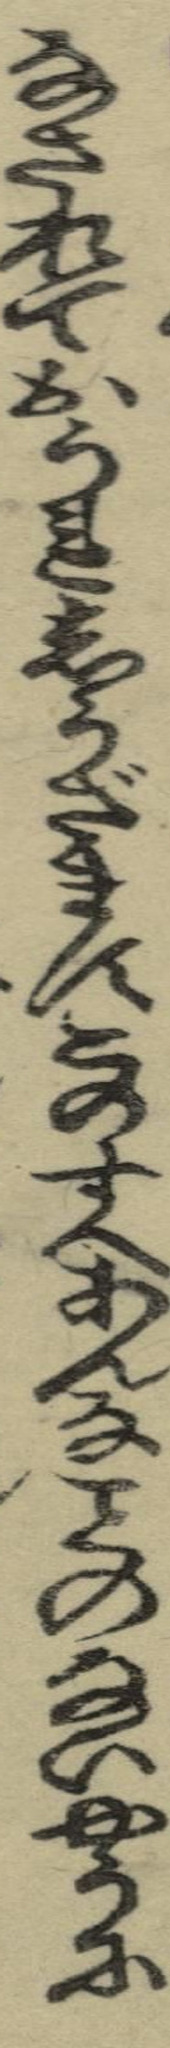なされておうれしうざますこのすへあんなことのないやうに
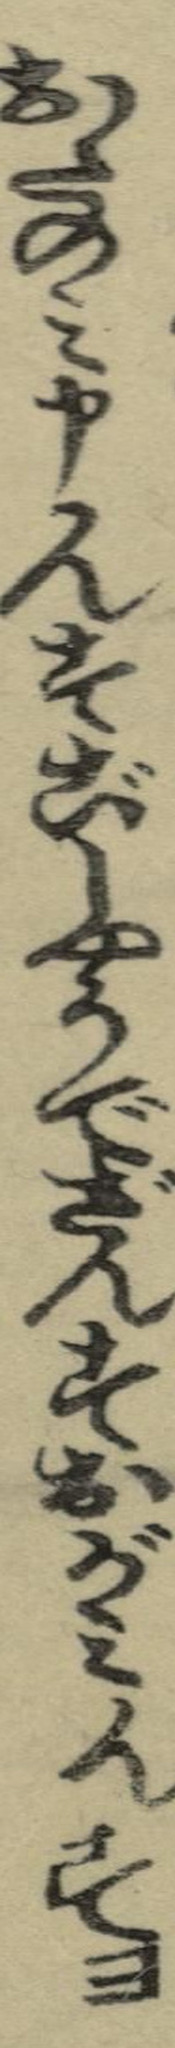おたのみ申んすごしやうでざんすおがみんすヨ
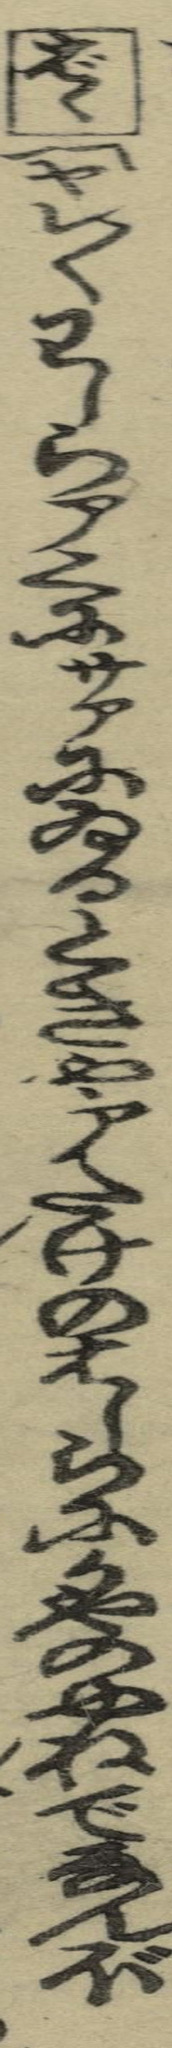ばゝ〽ヤレ〳〵わしらアくにサアにゐるときやアたけのはしらにかやのやねでなんぼ
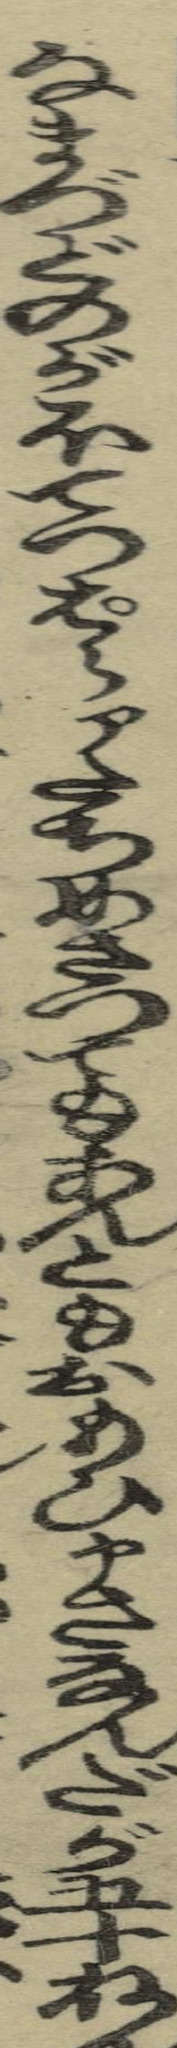なまづどのがほてつぱらアたちめさつてもあんともおもひ申さなんだが五十ねん
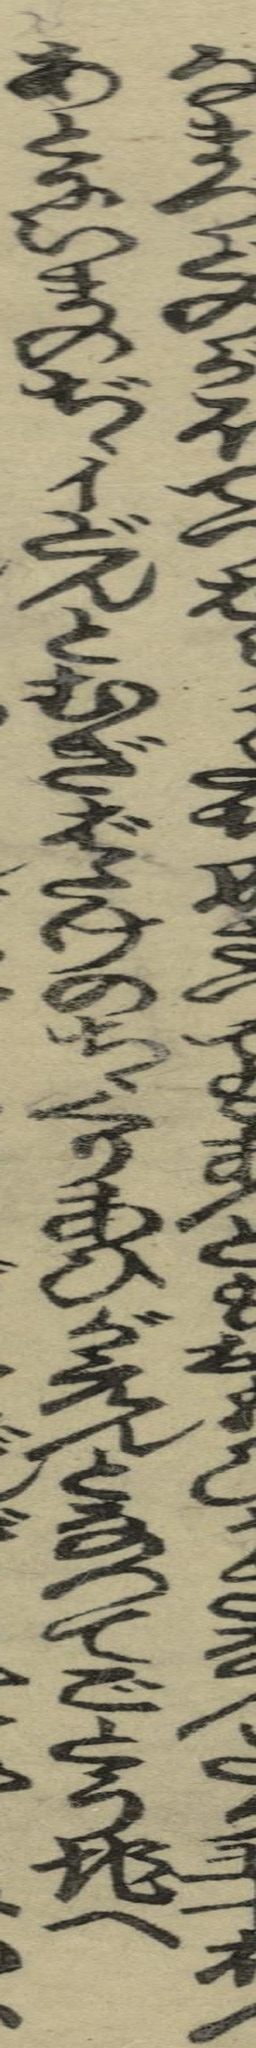あとにいまのぢゝイどんとむぎばたけのちゝくりあひがえんとなつてごとう地へ
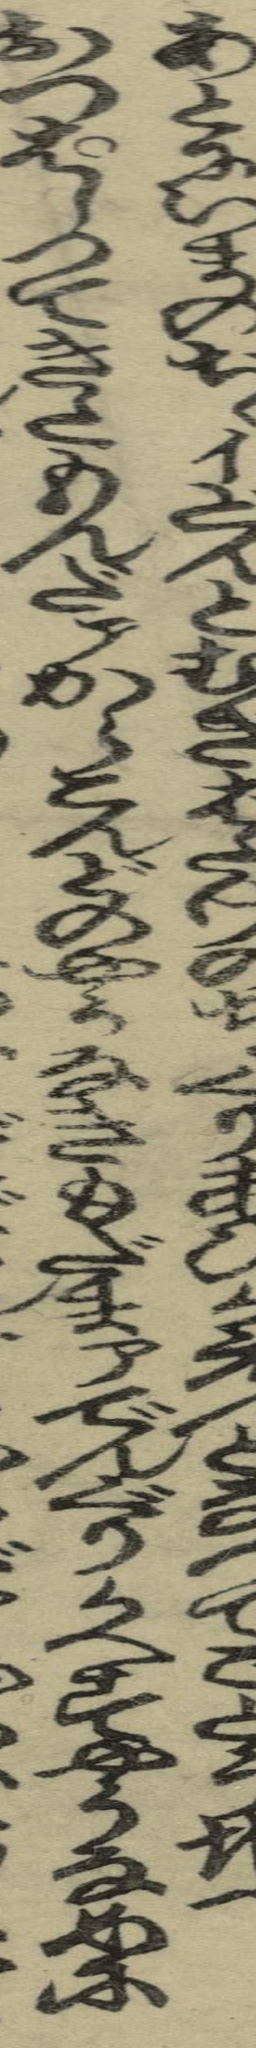おつぱしつてきたもんだアからこんどのやうなきもだまアでんぐりかへすやうなめに
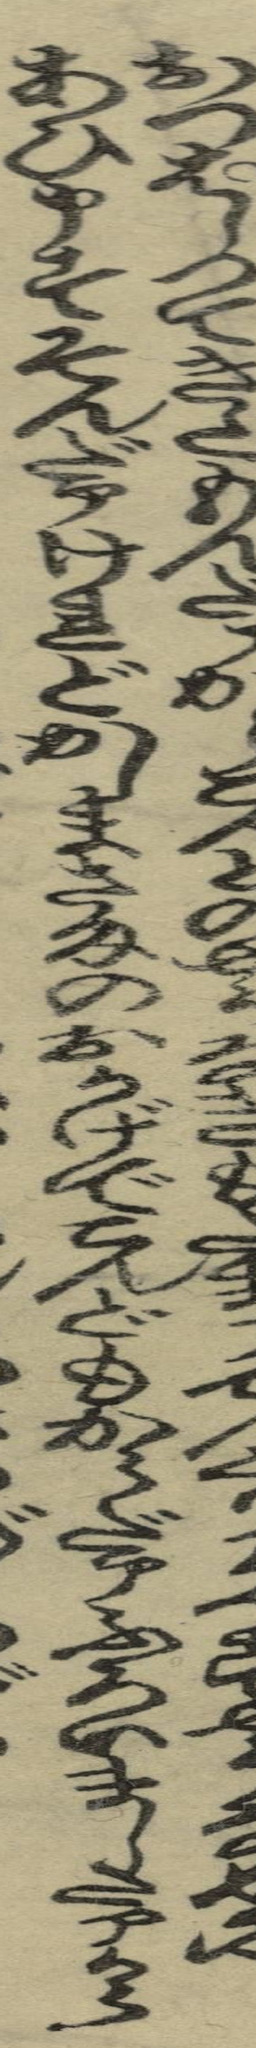あひ申すそんだアけれどかしまさまのおかげでこんどもからだアふろいましたアから
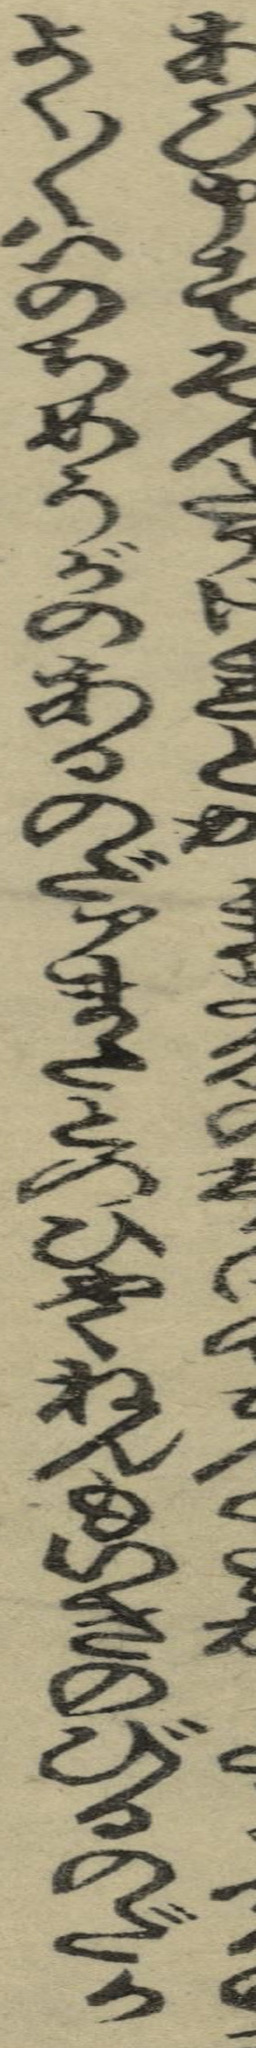よく〳〵いのちめうがのあるのだアまたとつひやくねんもいきのびるのだか
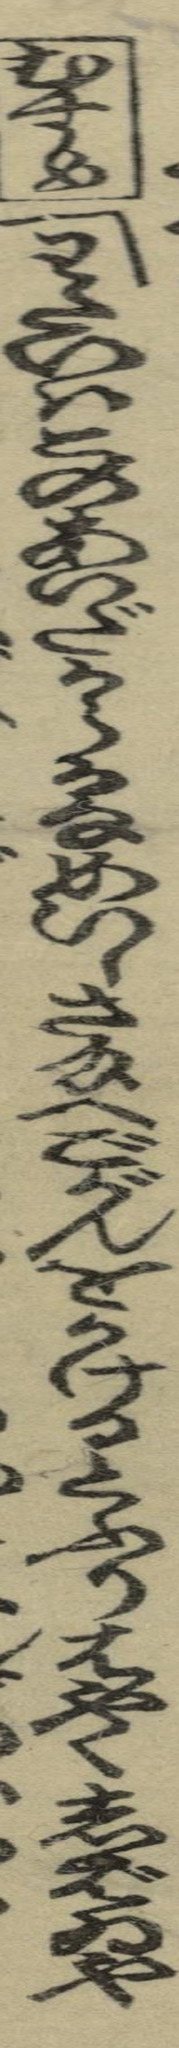むすめ〽わたいはこのあいだからかなめいしさまへごがんをかけるとふりはやくしばゐや
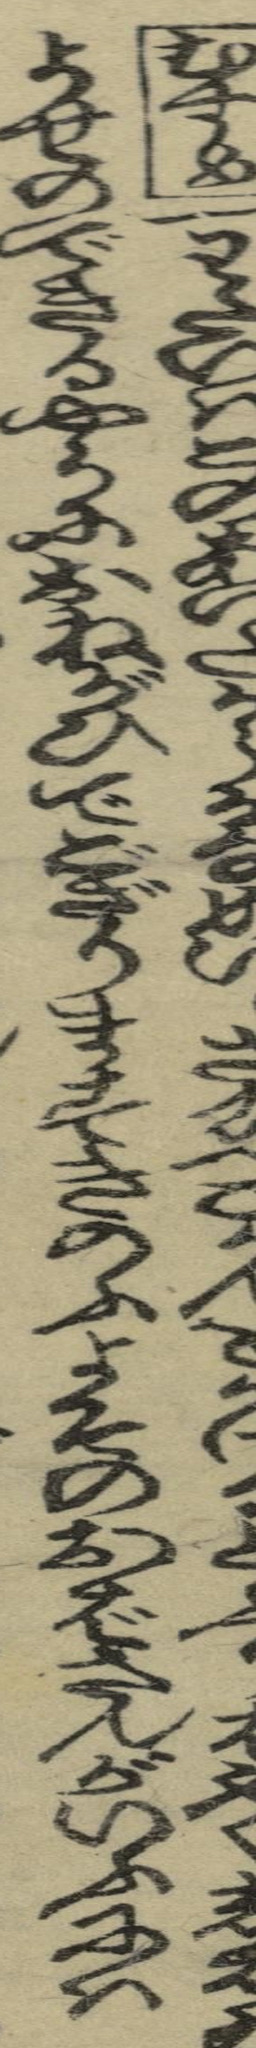よせのできるやうにおねがひでござりますきのふよそのおばさんがいふには
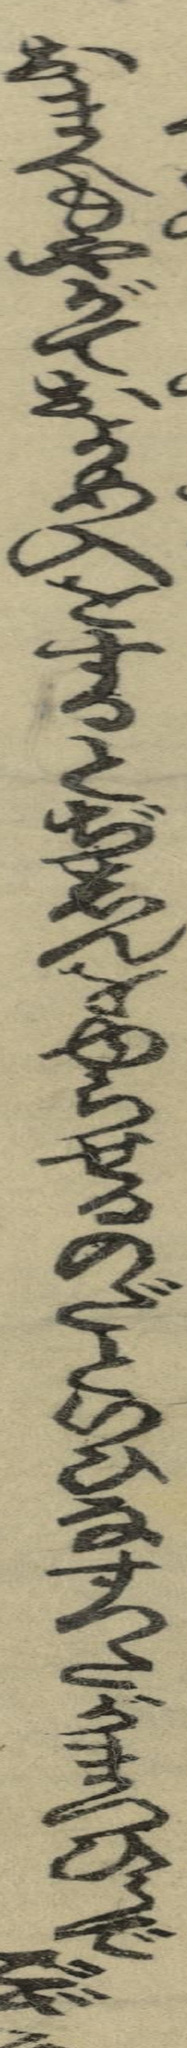おまへもやがておよめ入をするとぢしんをゆらせるのだといひなすつたがまつひらでござい升ヨ
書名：おそろ感心要石
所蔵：東京大学地震研究所図書室 Earthquake Research Institute Library, The University of Tokyo, JAPAN
